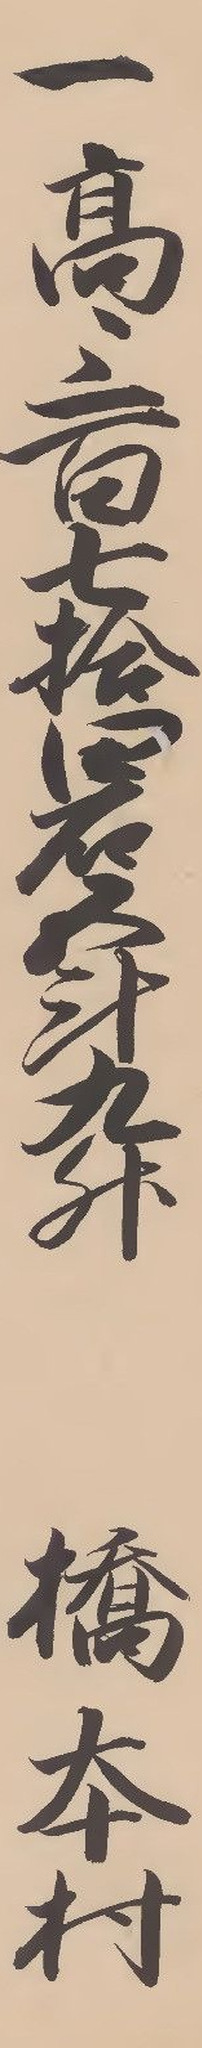一高三百七拾四石五斗九升橋本村
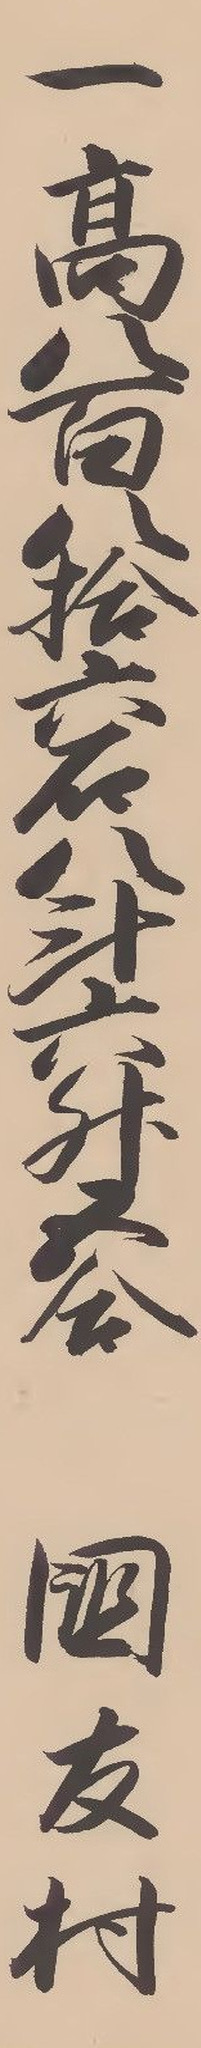一高八百八拾六石八斗六升五合国友村
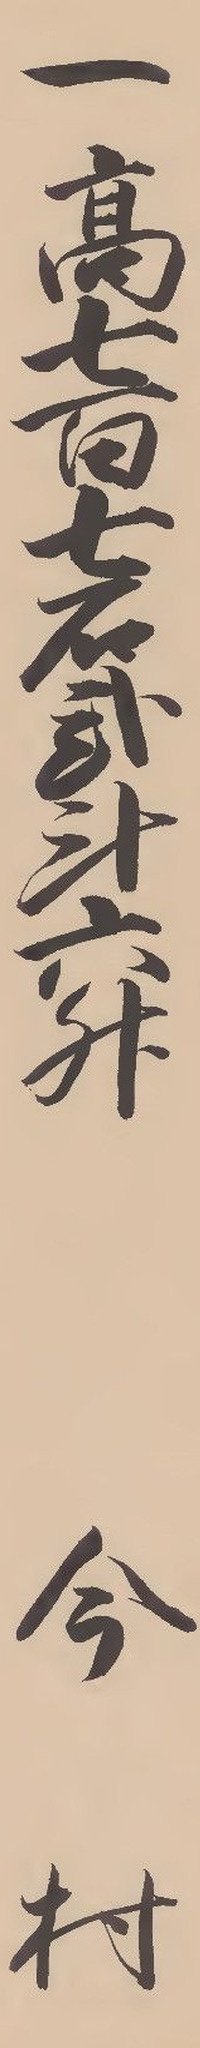一高七百七石弐斗六升今村
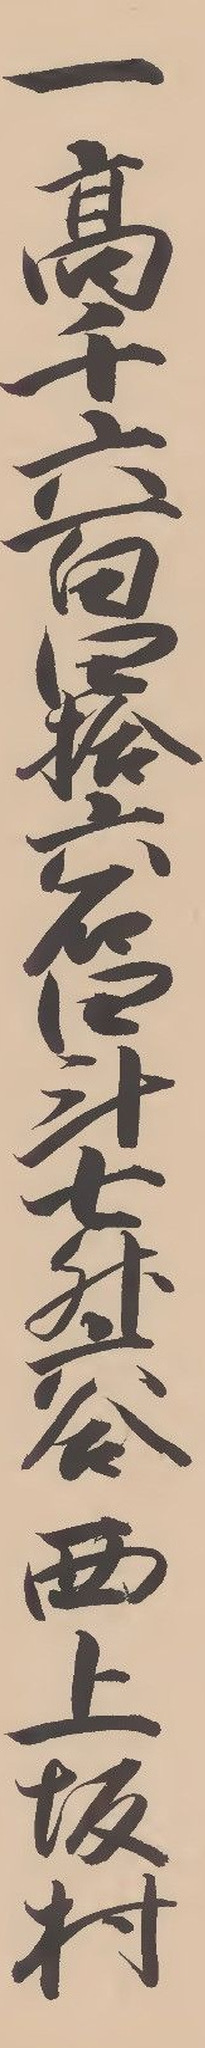一高千六百四拾六石四斗七升六合西上坂村
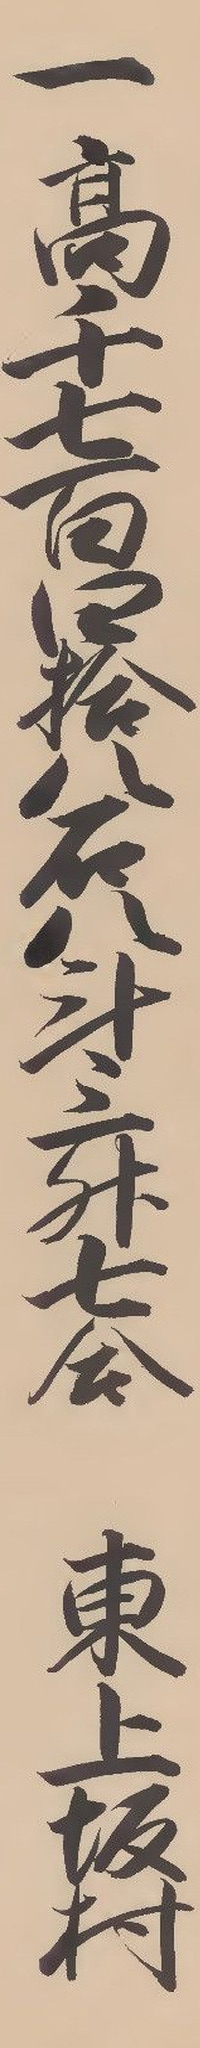一高千七百四拾八石八斗三升七合東上坂村
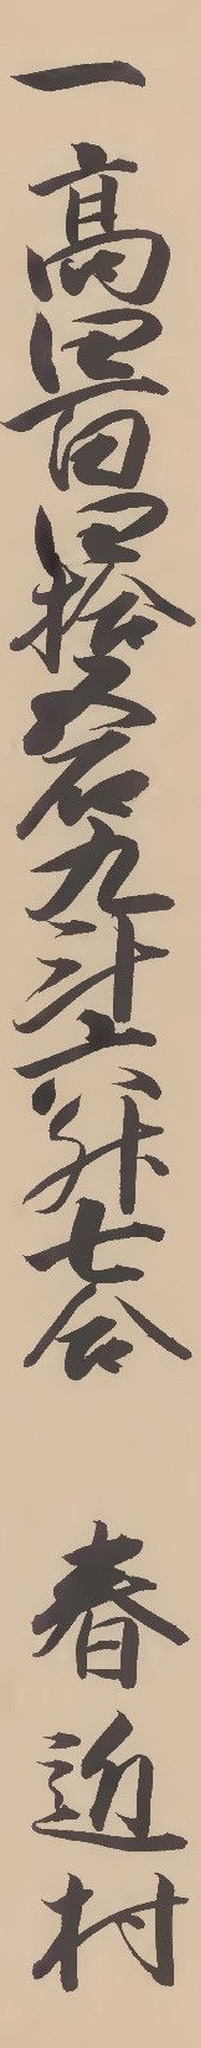一高四百四拾五石九斗六升七合春近村
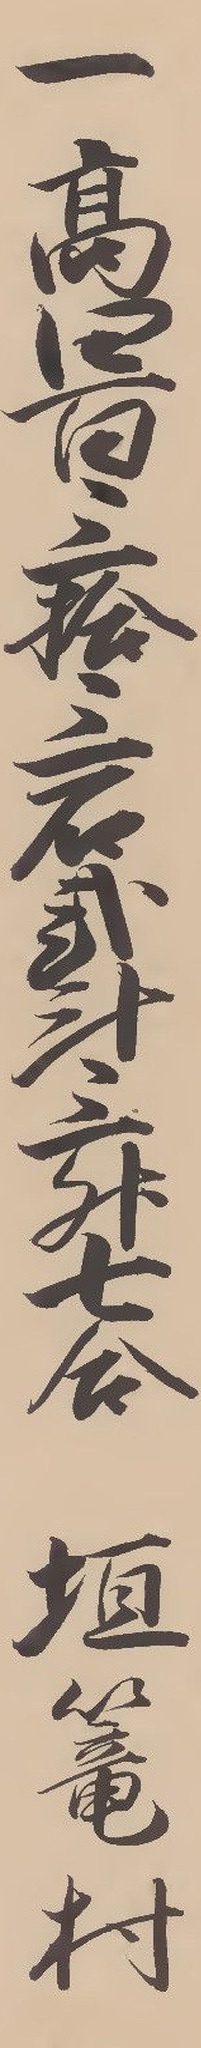一高四百三拾三石弐斗三升七合垣篭村
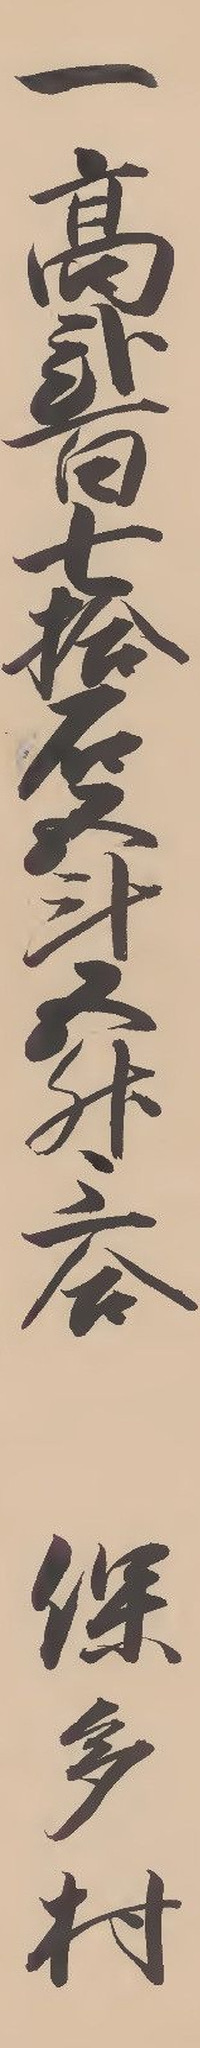一高弐百七拾石五斗五升三合保多村

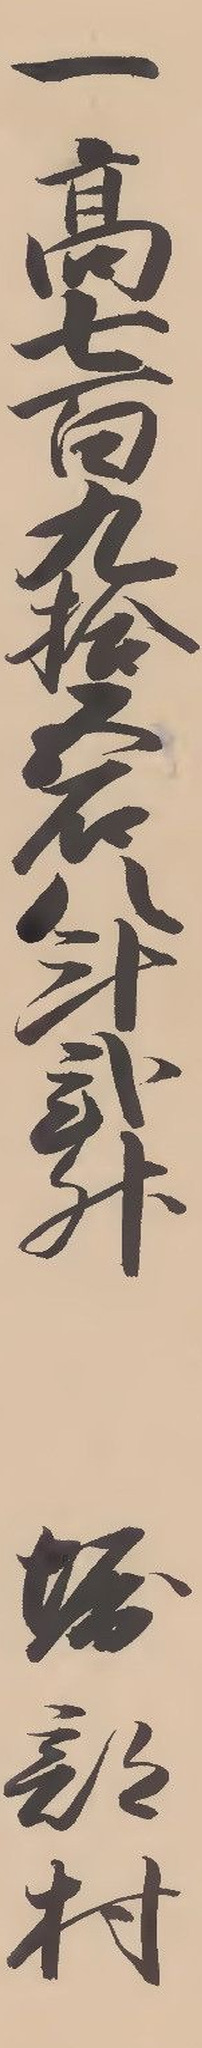一高七百九拾五石八斗弐升堀部村
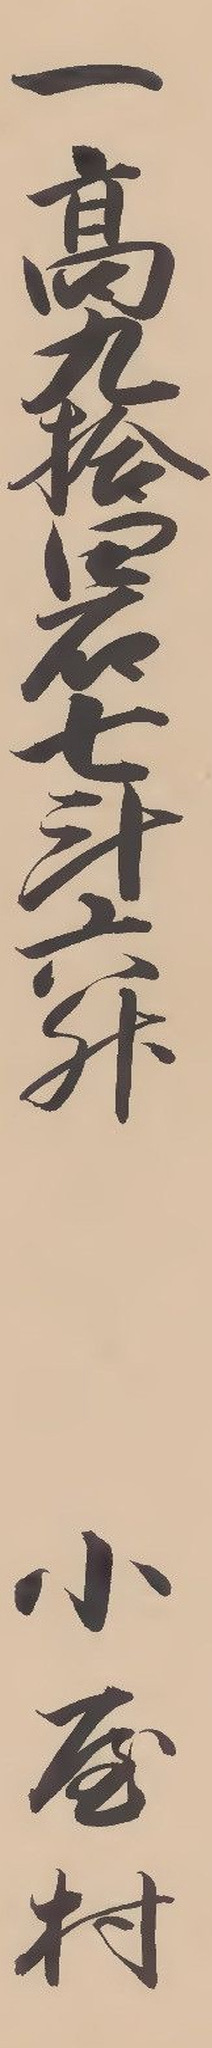一高九拾四石七斗六升小屋村
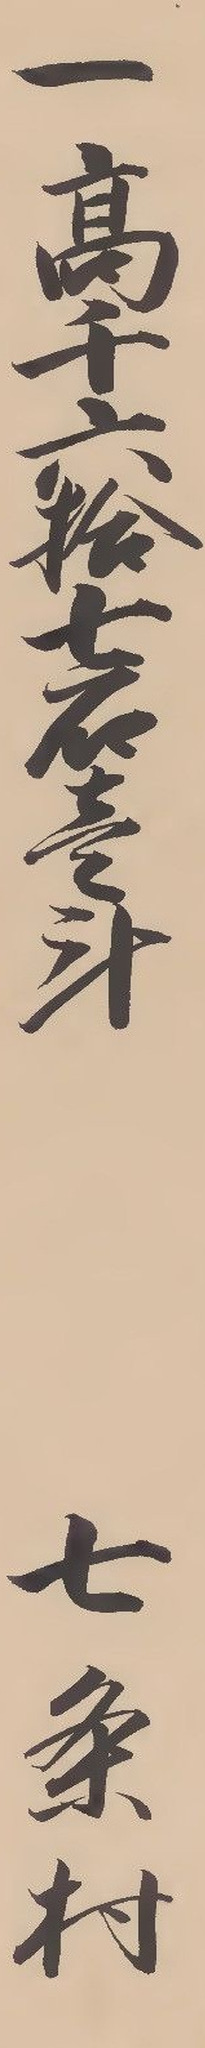一高千六拾七石壱斗七条村
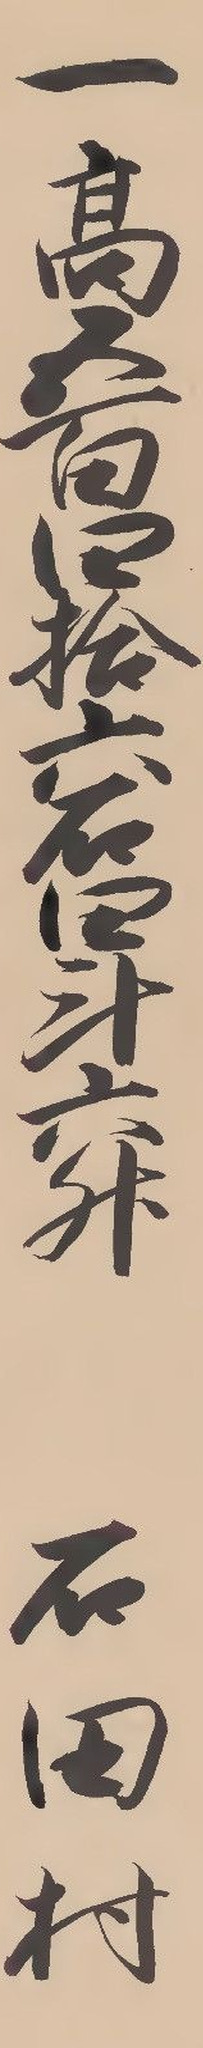一高五百四拾六石四斗六升石田村
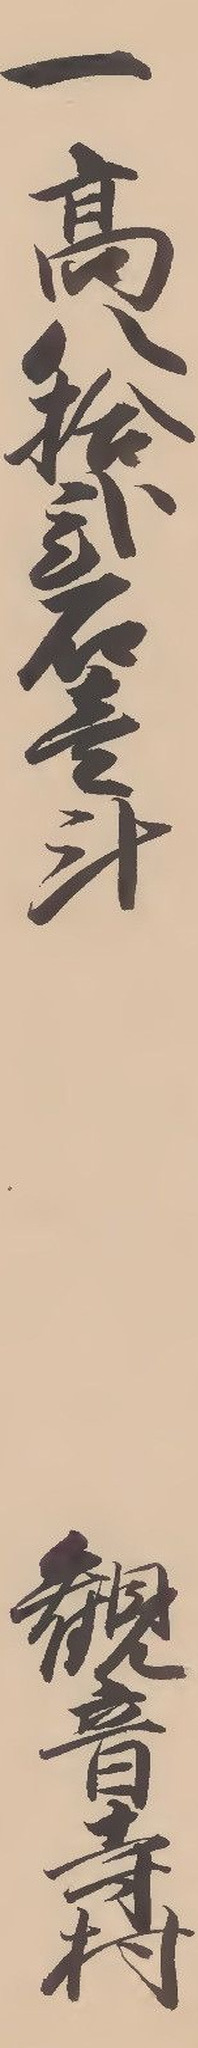一高八拾弐石壱斗観音寺村
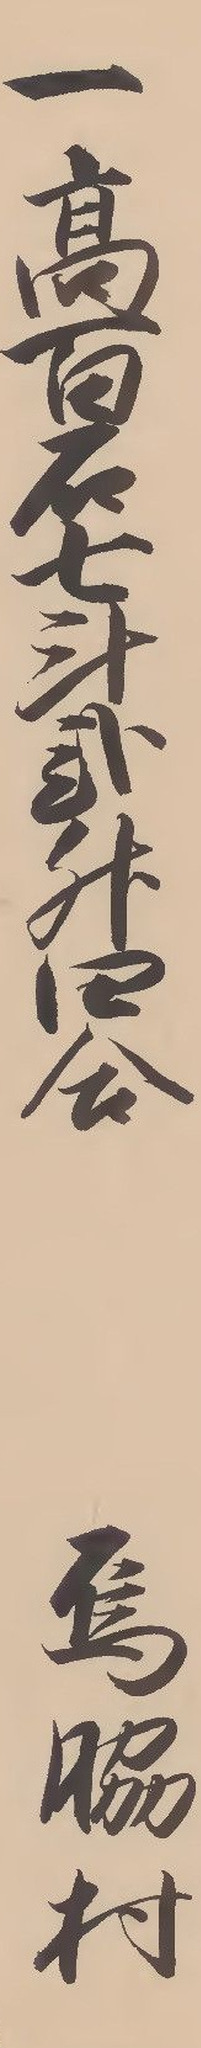一高百石七斗弐升四合烏脇村
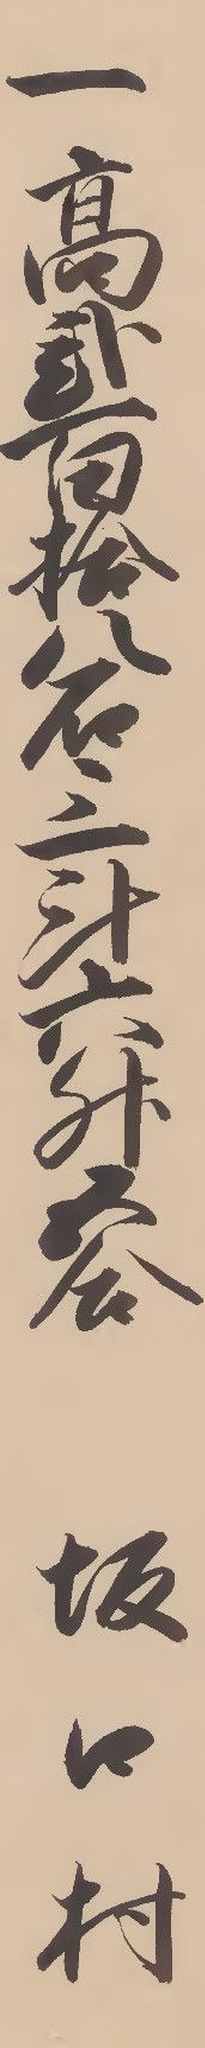一高弐百拾八石三斗六升五合坂口村
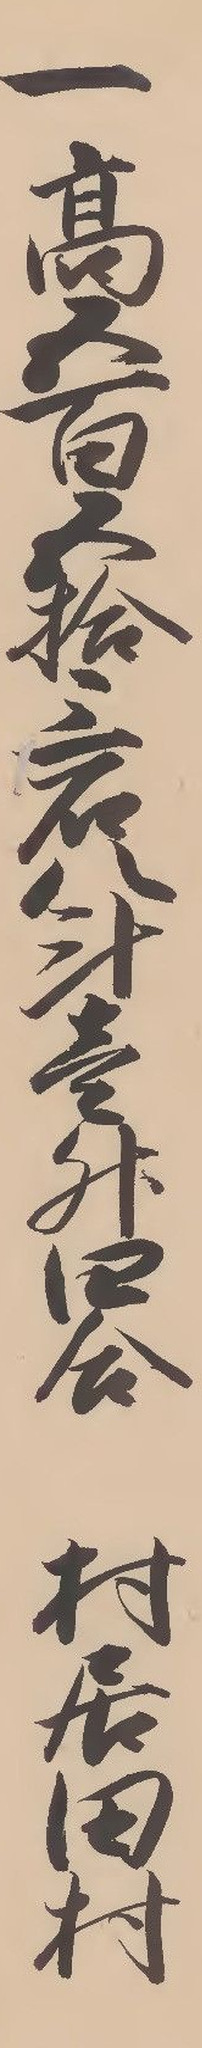一高五百五拾三石八斗壱升四合村居田村
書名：近江国郷帳
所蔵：国立公文書館 National Archives of Japan
